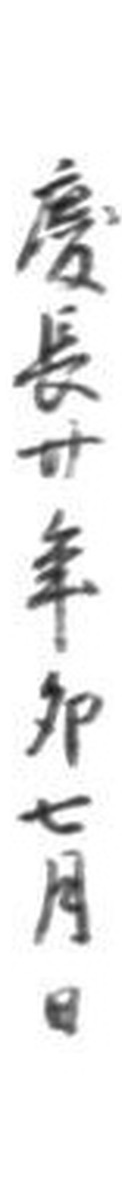慶長廿年卯七月日
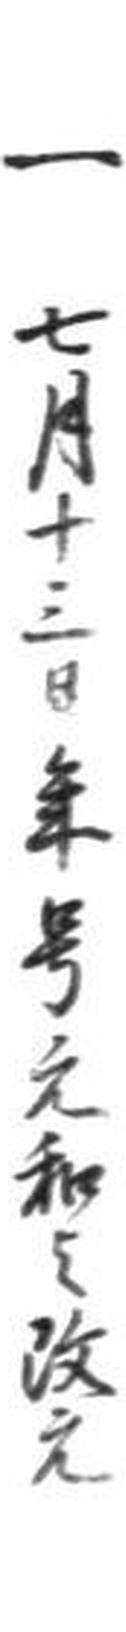一七月十三日年号元和与改元
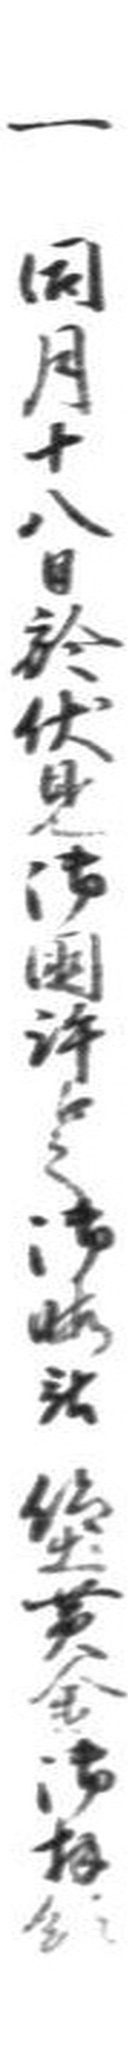一同月十八日於伏見御国許江之御暇被仰出貰金御拝領
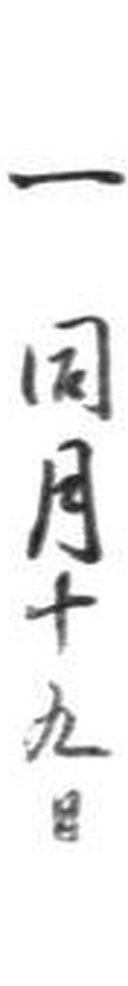一同月十九日

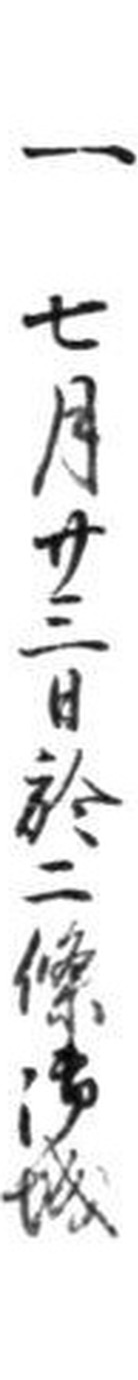一七月廿三日於二條御城
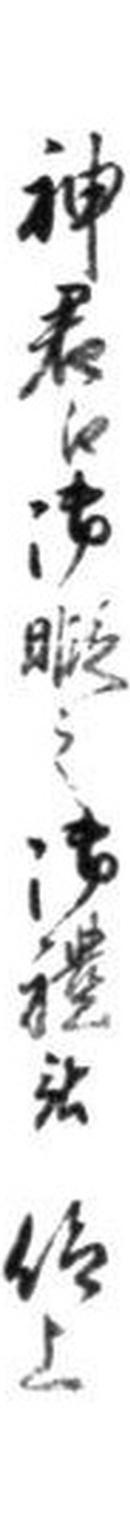神君江御暇之御礼被仰上
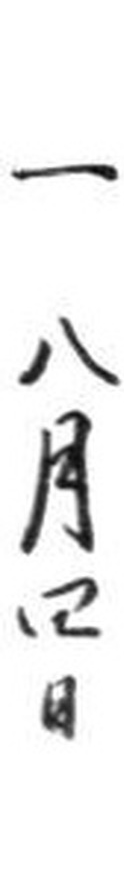一八月四日
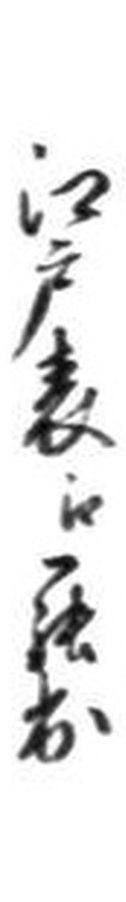江戸表江罷出
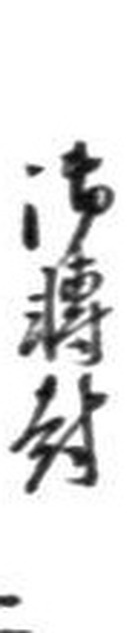御転封
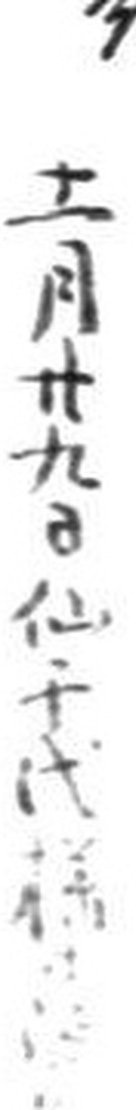十一月廿九日仙千代様御誕生
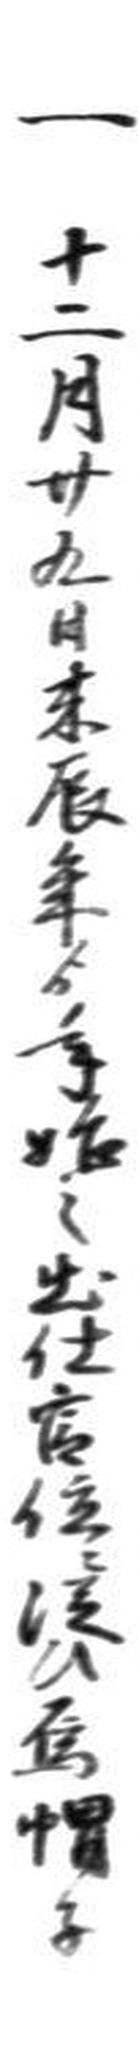一十二月廿九日来辰年ゟ年始之出仕官位ニ従ひ烏帽子
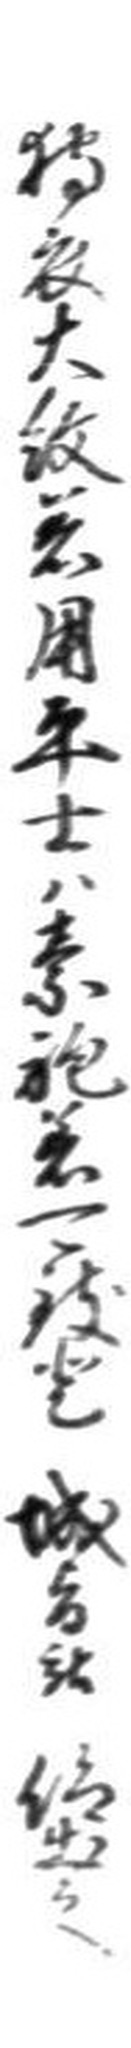狩衣大紋着用平士ハ素袍着可致登城旨被仰出之

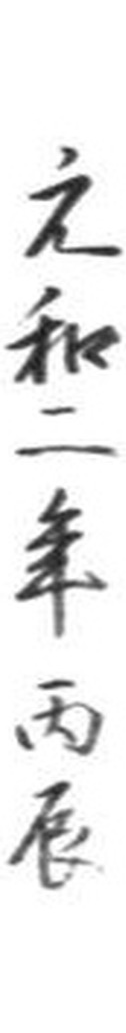元和二年丙辰
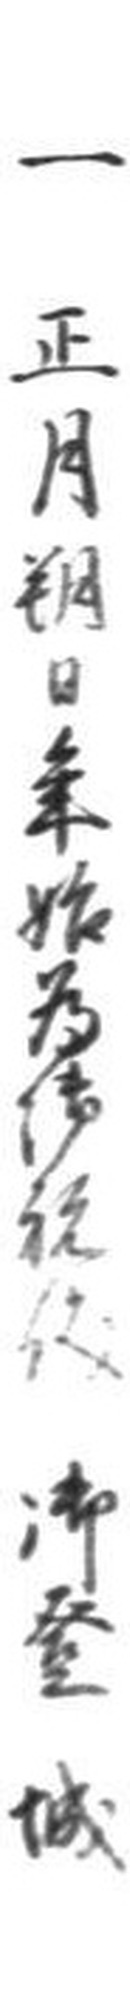一正月朔日年始為御祝儀御登城
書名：家譜 二 忠直公 従文禄四年到慶安四年
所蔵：福井県文書館 Fukui Prefectural Archives
